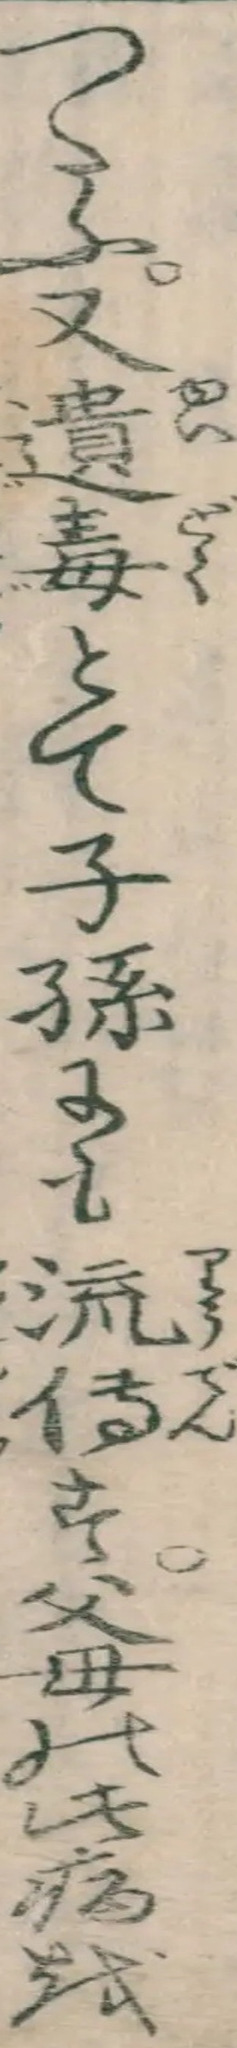つたふ。又遺毒とて子孫にも流傅ス。父母の此病を

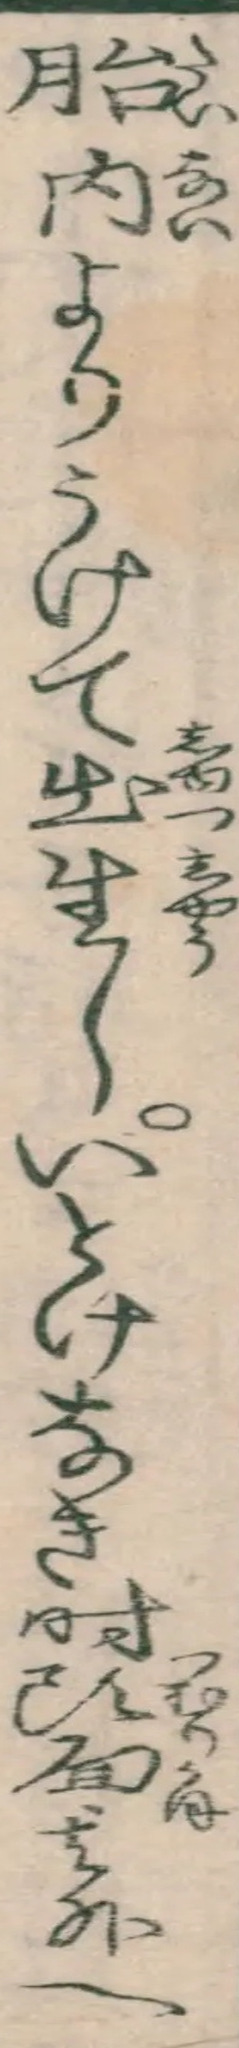胎内よりうけて出生し。いとけなき時頭面其外へ
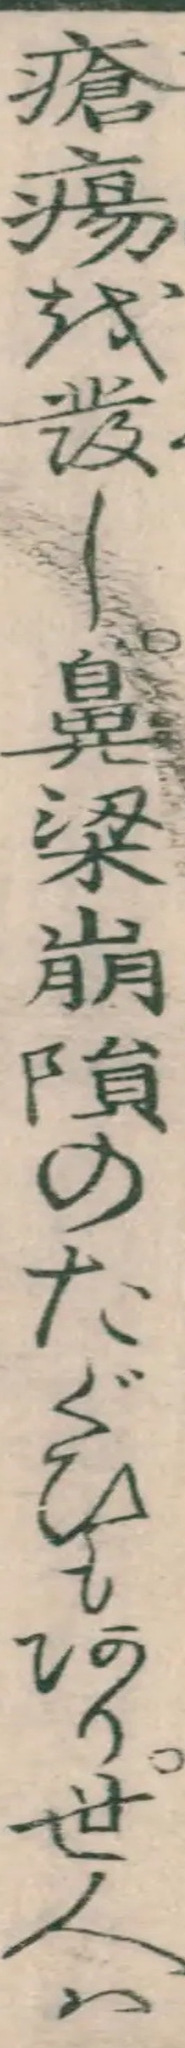瘡瘍を發し。鼻梁崩隕のたゞひもあり。世人は
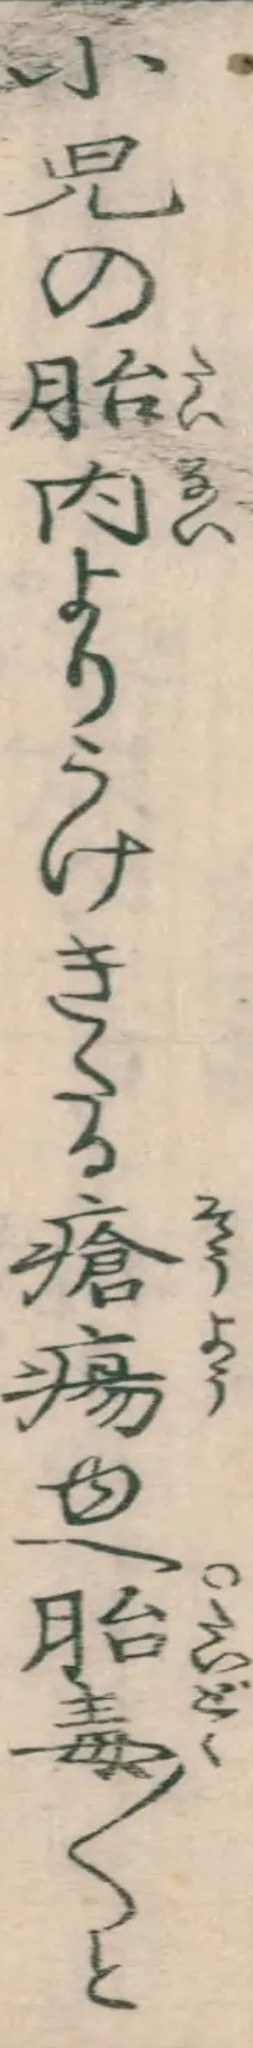小児の胎内よりうけきくる瘡瘍ゆへ。胎毒〳〵と
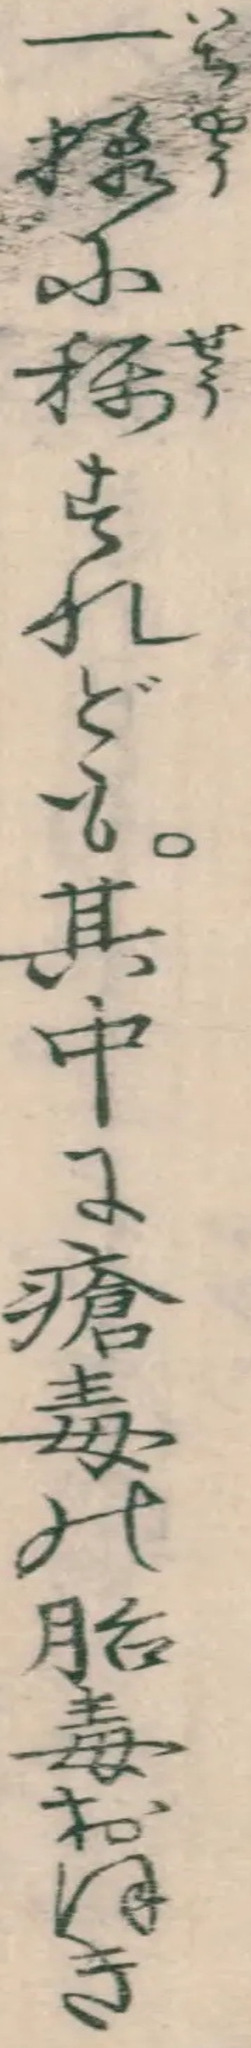一様に称すれども。其中に瘡毒の胎毒おひほき
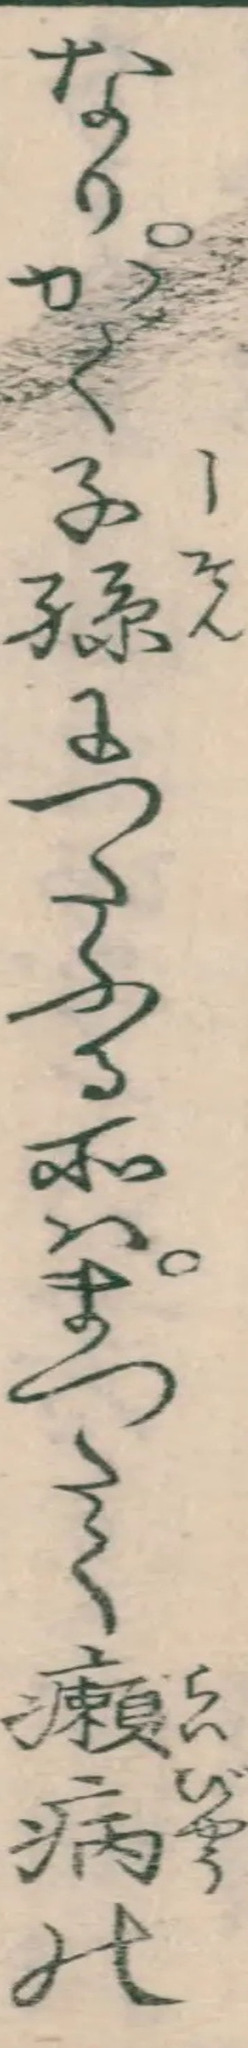なり。かく子孫につたふる所は。まつたく癩病の
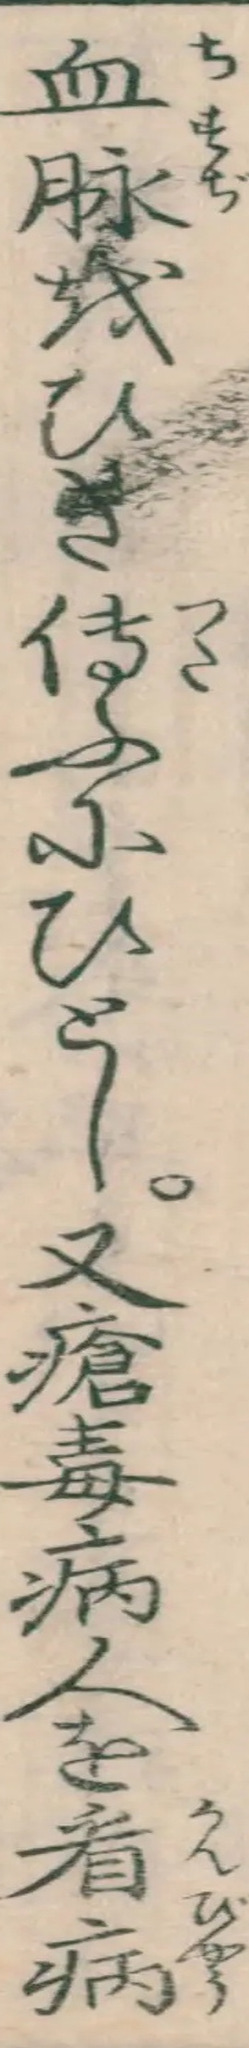血脉をひき傳ふにひとし。又瘡毒病人を看病
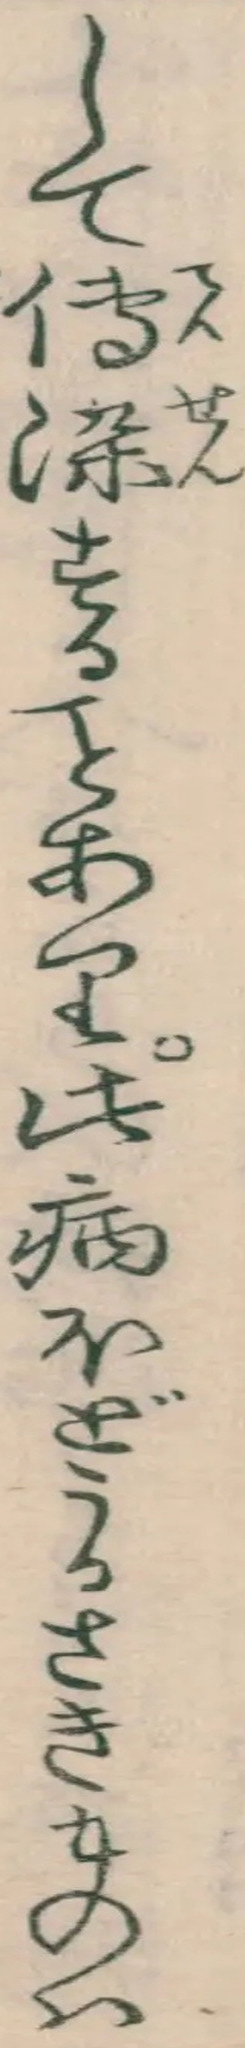して傅染することあり。此病ほどうるさきものは
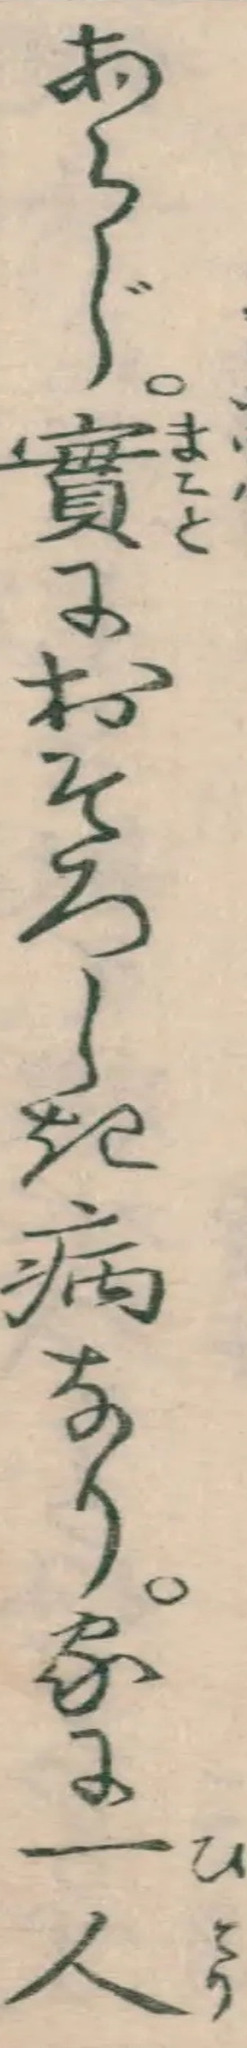あらじ。實におそろしき病なり。家に一人
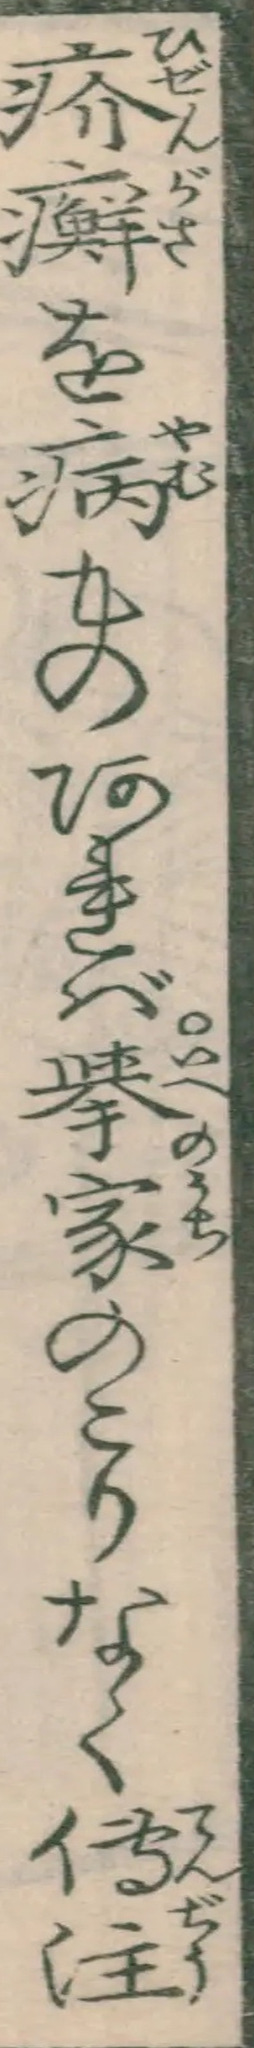疥癬を病ものあれば。挙家のこりなく傅住
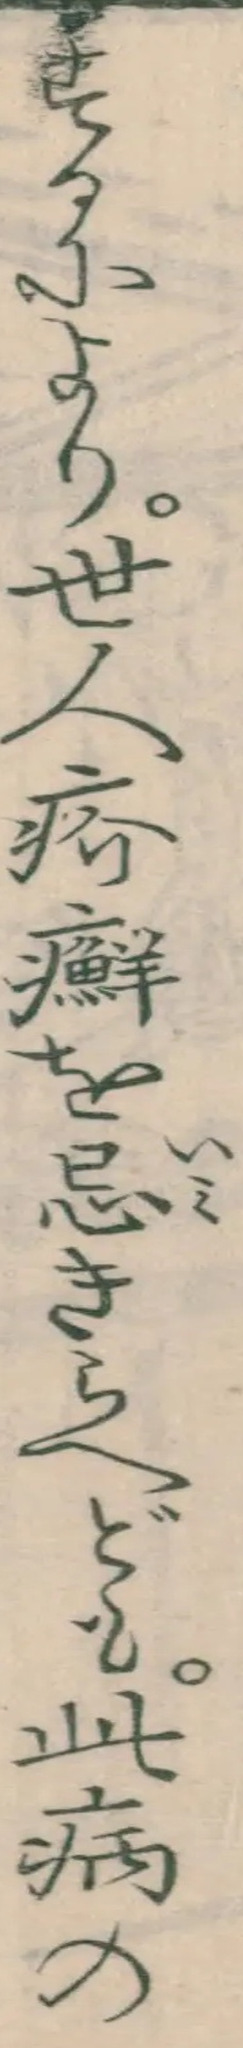するにより。世人疥癬を忌きらへども。此病の
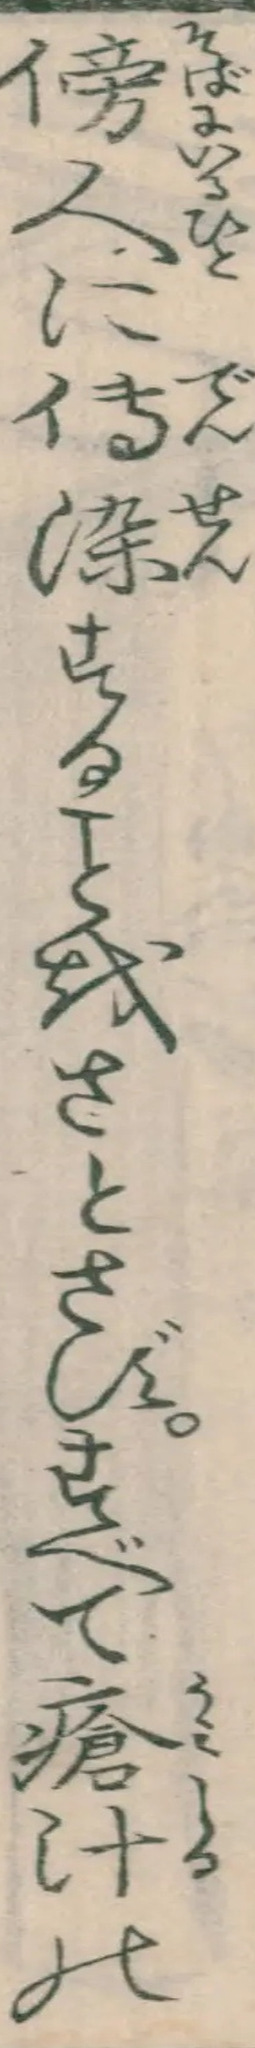傍人に傳染することをさとさず。すべて瘡汁の
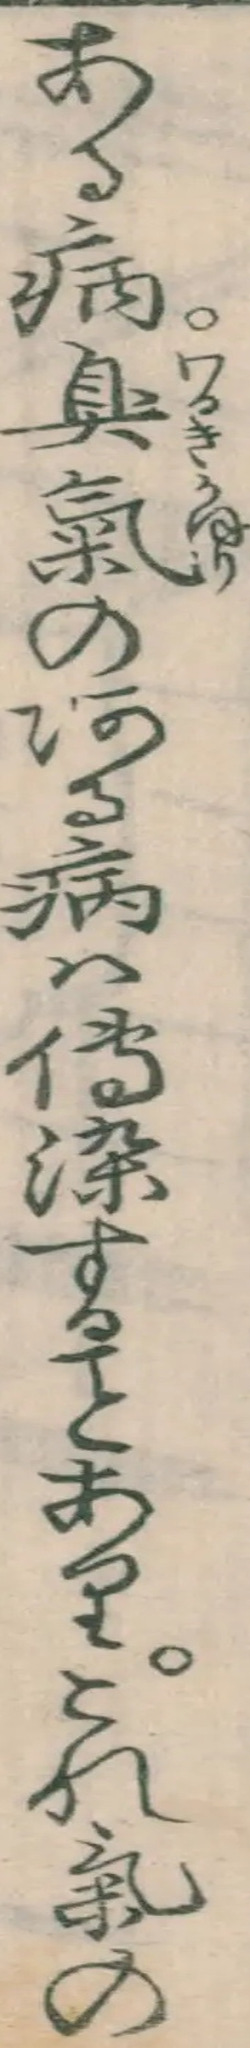ある病。臭気のある病は傅染することあり。これ氣の
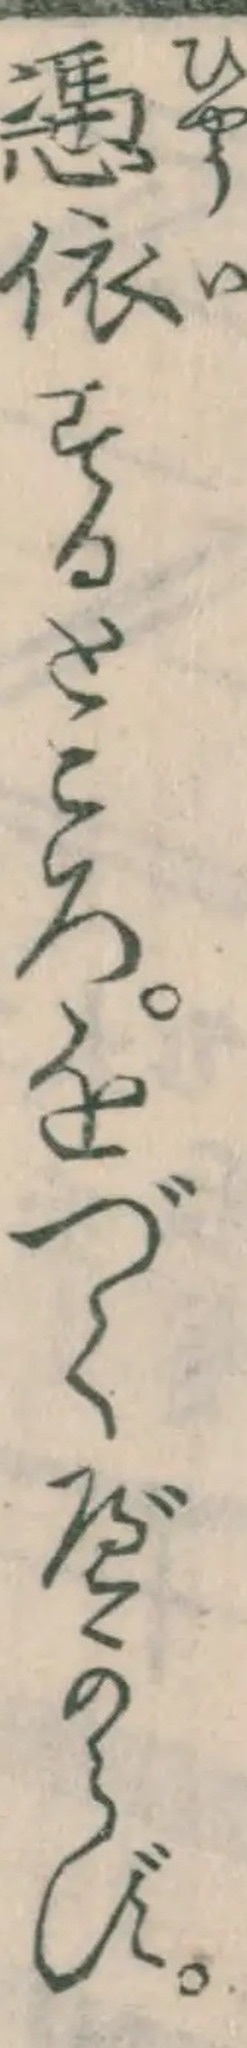憑依するところ。をづくべからず。
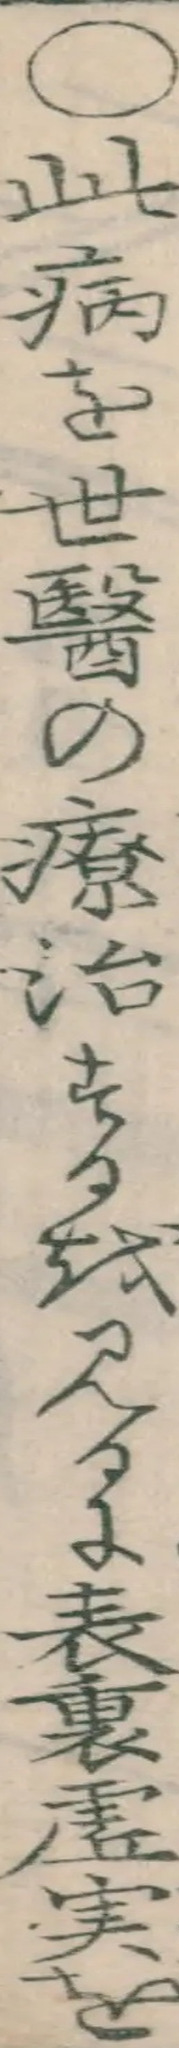〇此病を世醫の療治するを見るに。表裏虚実を
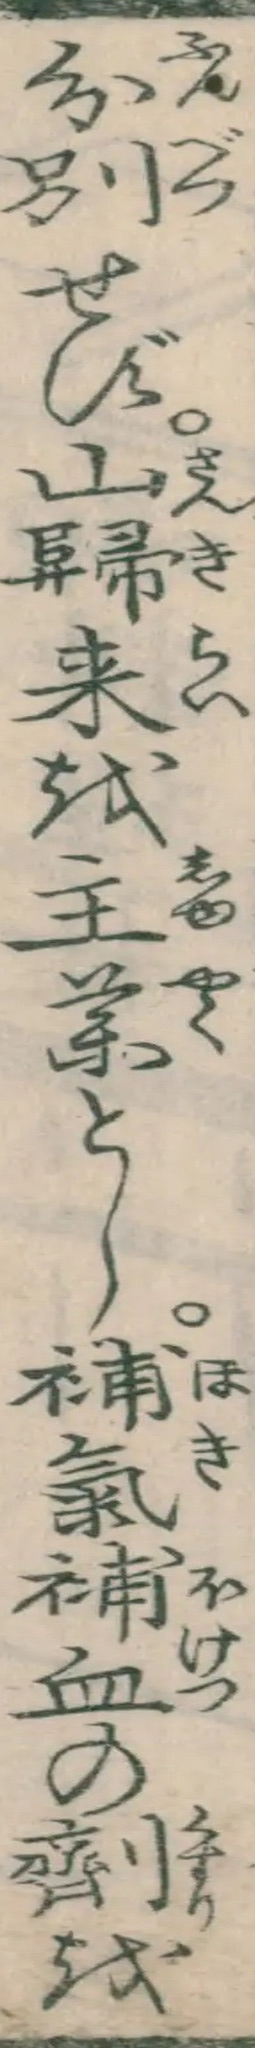分別せず。山帰来を主薬とし。補器補血の剤を
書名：瘡家示訓
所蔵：国立国会図書館 National Diet Library, JAPAN
